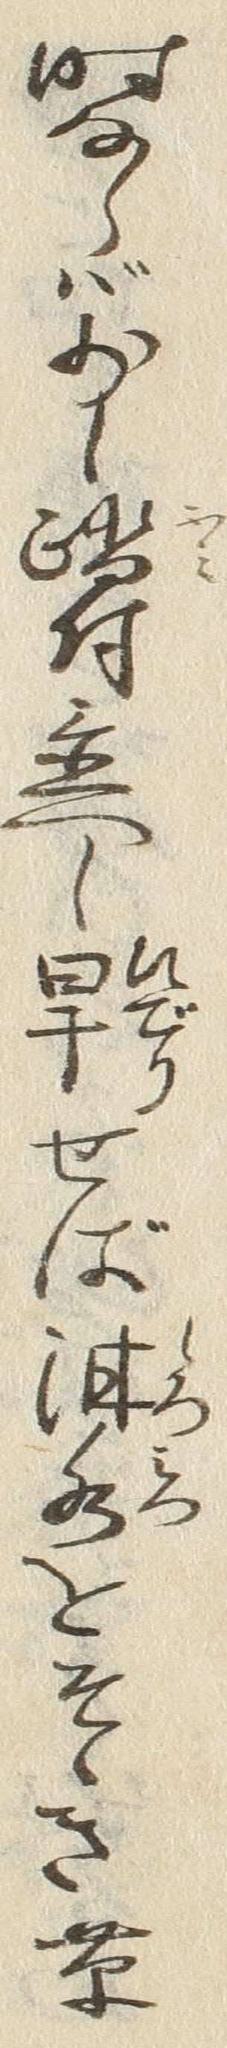時ならば少し踏付置へし旱せば湛水をそゝき草
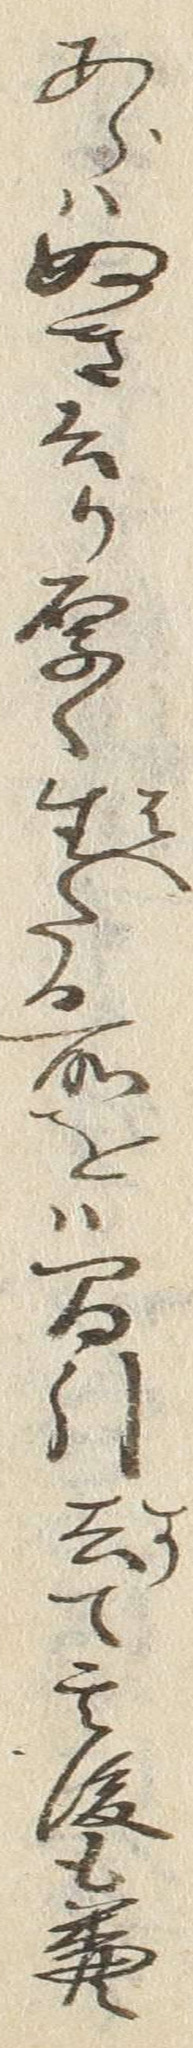あらはぬき去り厚く生たる所をは間引去て其後も糞
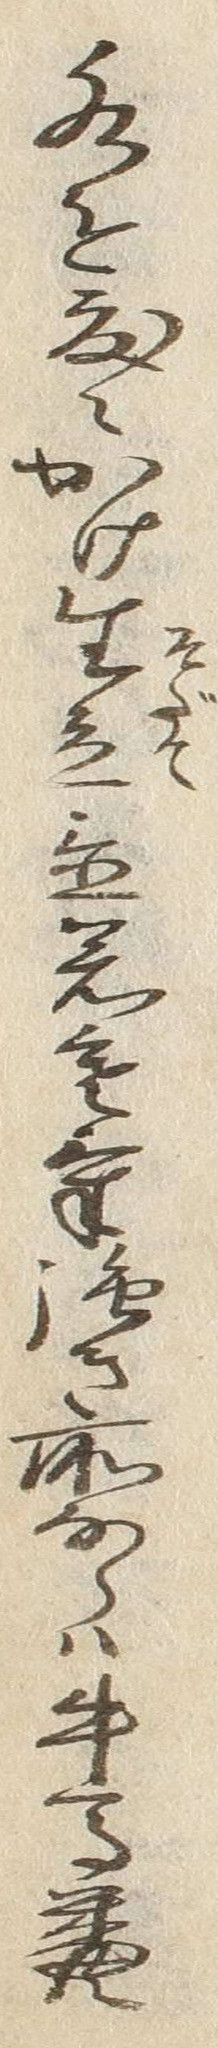水を度々かけ生立置若寒気強き所ならは牛馬糞

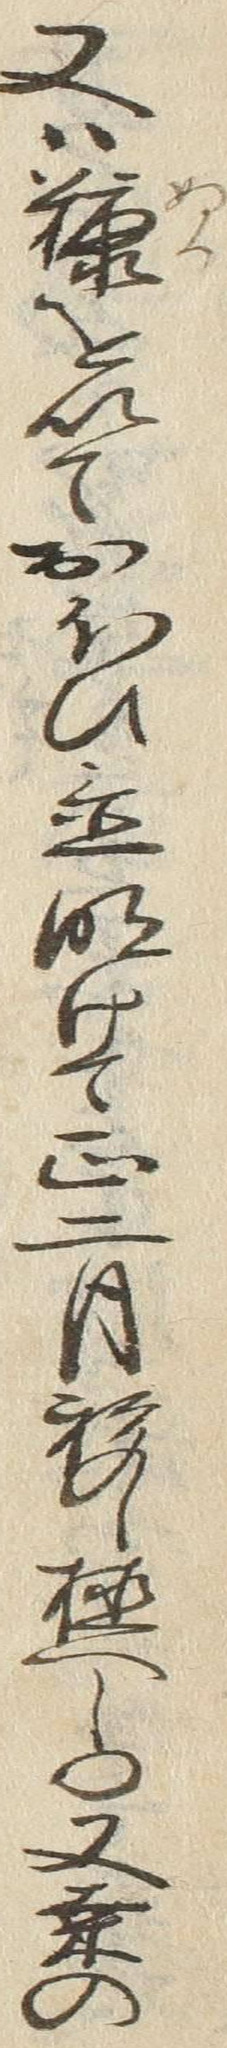又は糠を以てお不ひ置明けて正二月写し植へし〇又桑の
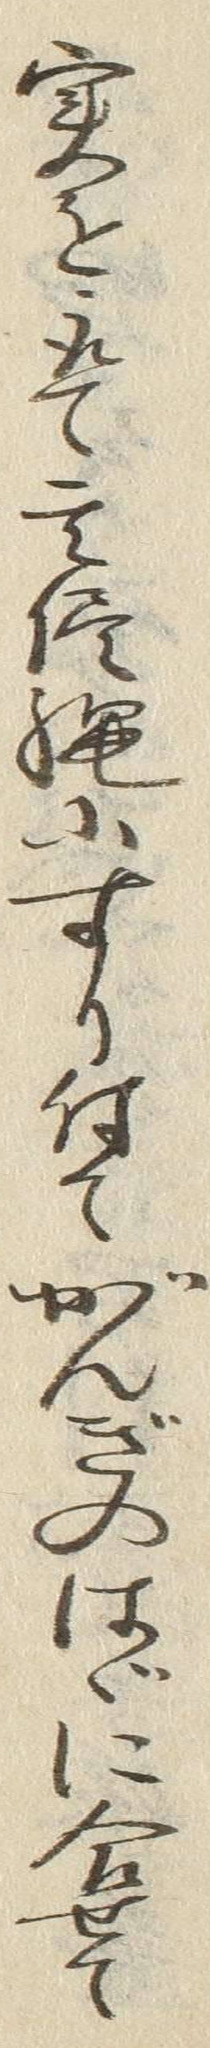実を取て其侭縄尓すり付てがんぎのはゞに合せて
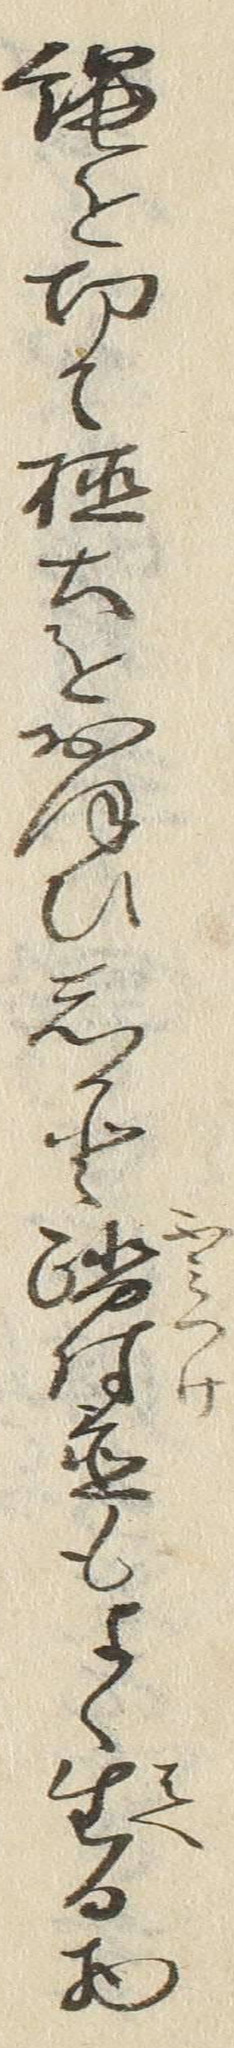縄を切て植土をおほひ志か登踏付置もよく生る物
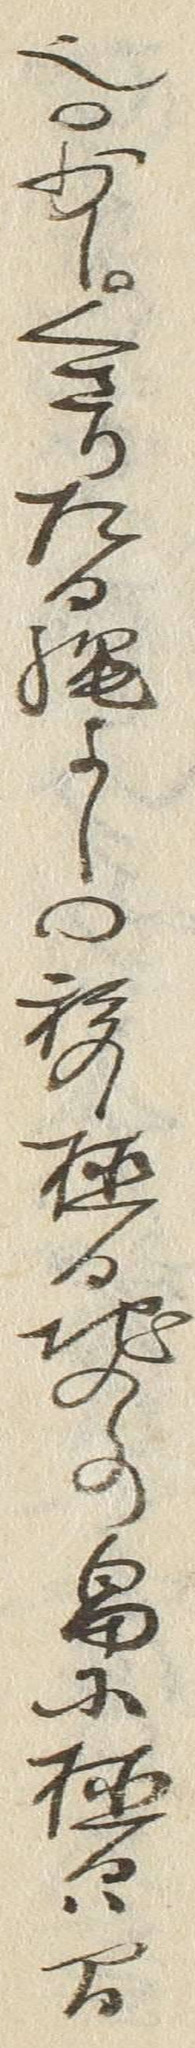也〇少し。くさりたる縄よし〇移し植る地の事畠尓植るは間
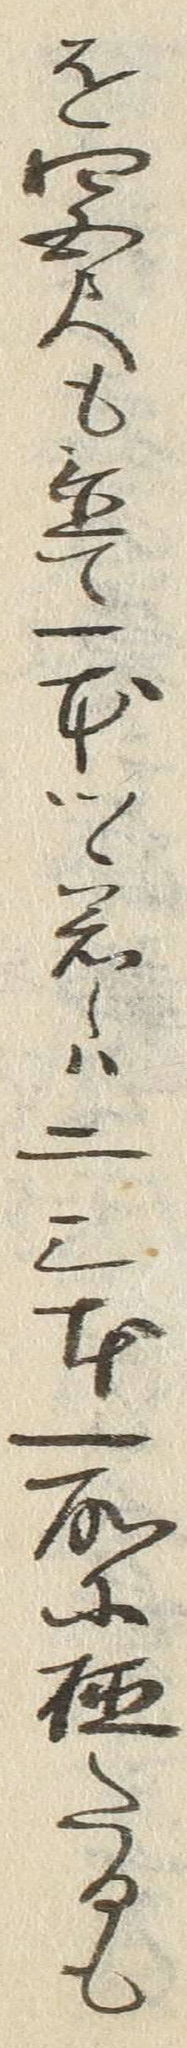を四五尺も置て一本ツヽ着しは二三本一所尓植たるも
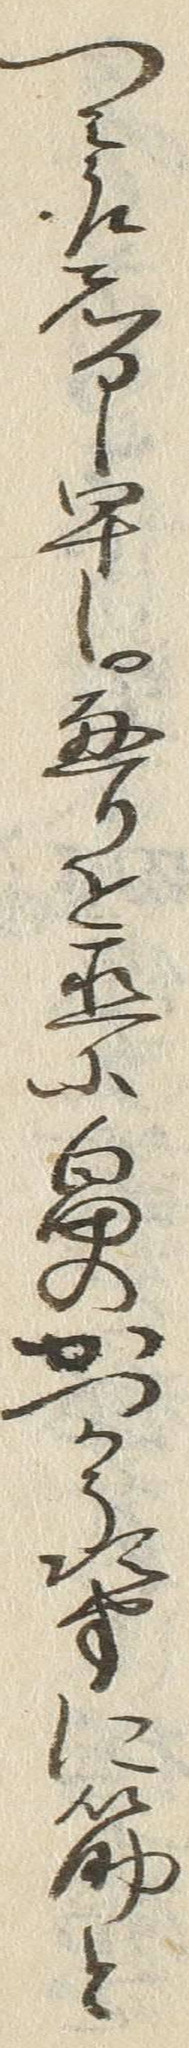つみ取志るし早し。通りを直尓畠のかつかう次第に筋と
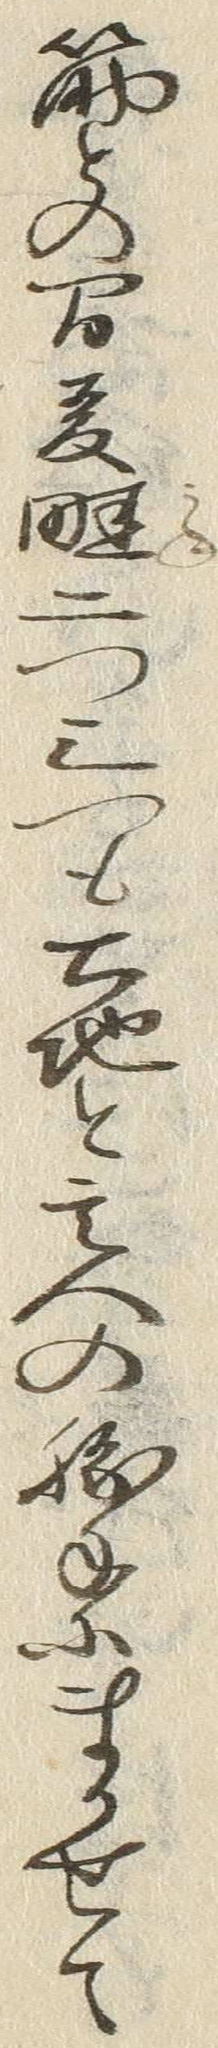筋との間麦畦二つ三つも土地と其人の勝手尓まかせて
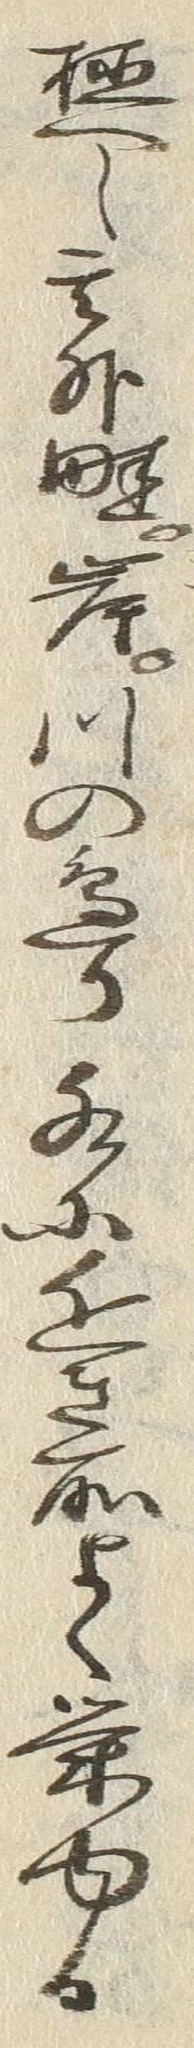植へし其外畦。岸。川の邊り水尓近き所よく栄ゆる
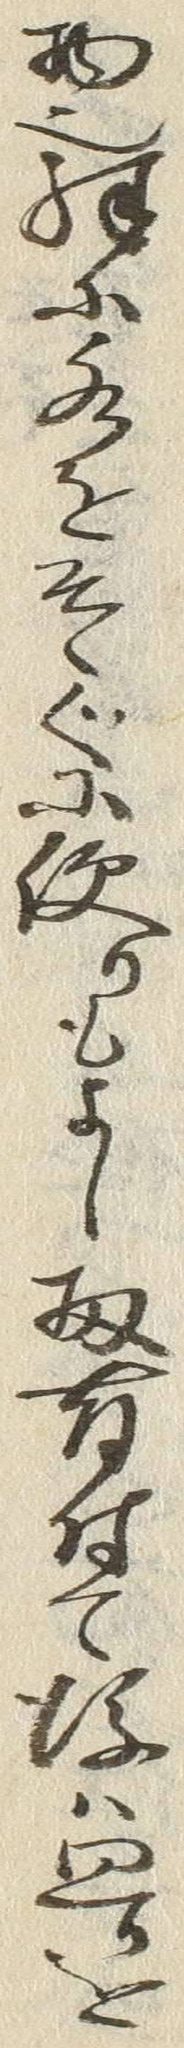物也殊尓水をそヽぐ尓便りもよし扨有付て後は廻りを
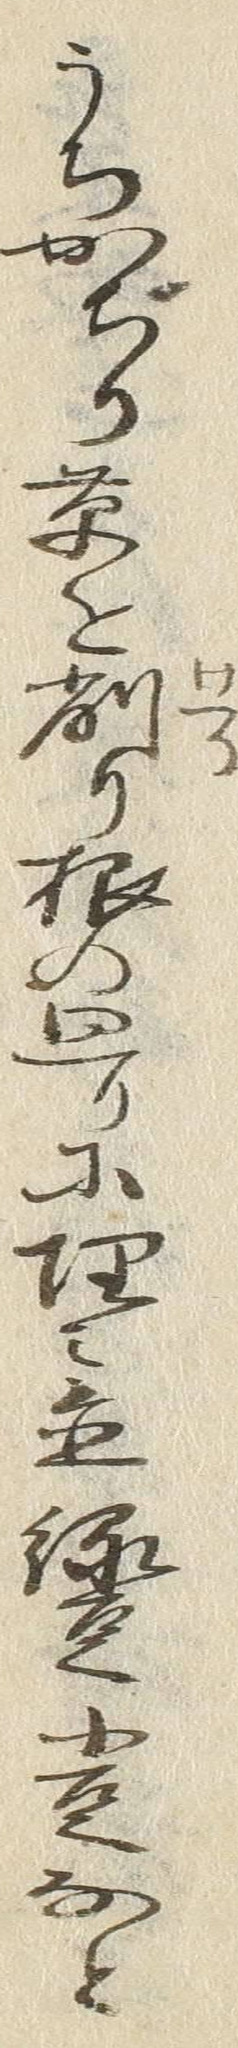うちかぢり草を削り根の廻り尓埋み置緑豆小豆なと
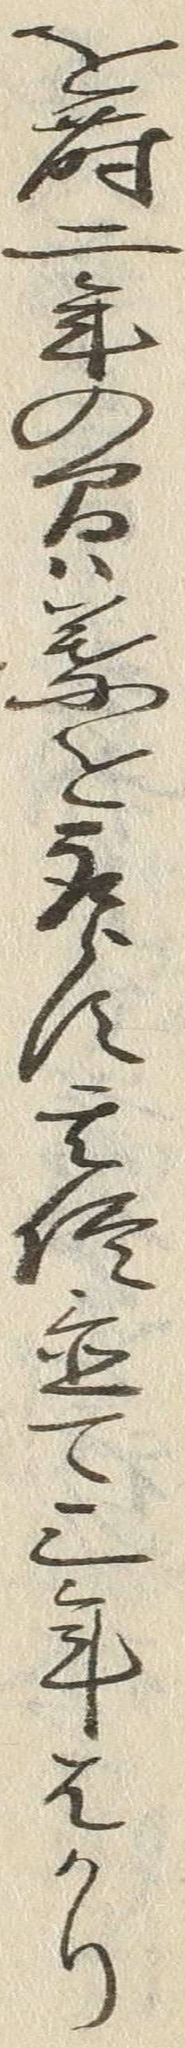を蒔二年の間は葉を取ら須其侭置て三年はかり
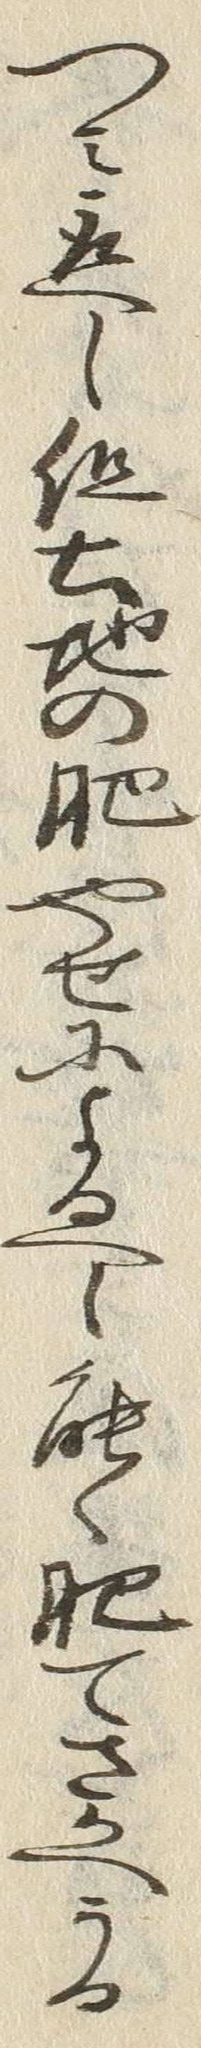つみ取へし但土地の肥やせ尓よるへし能く肥てさかへうる
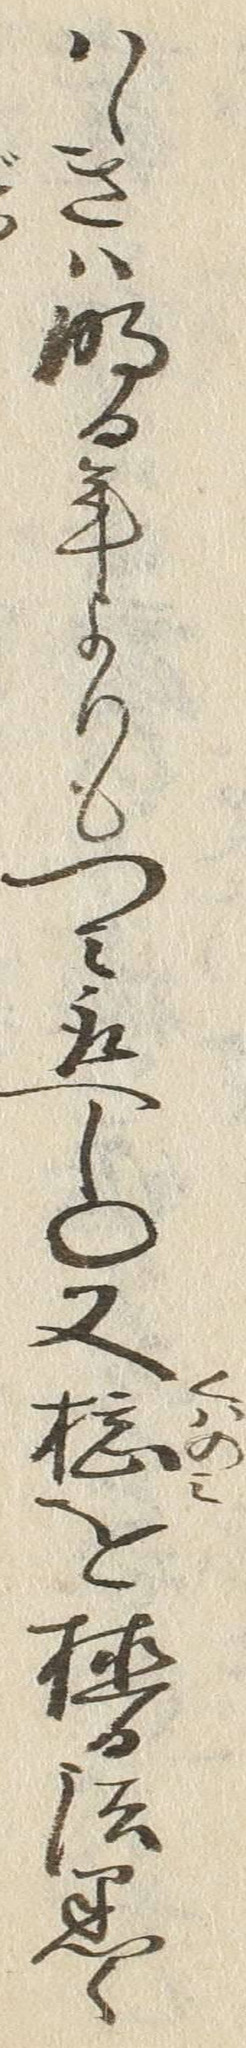はしきは明る年よりもつみ取へし〇又椹を植る法黒く
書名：養蠶實驗録後編
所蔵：東京大学農学生命科学図書館 国文学研究資料館
